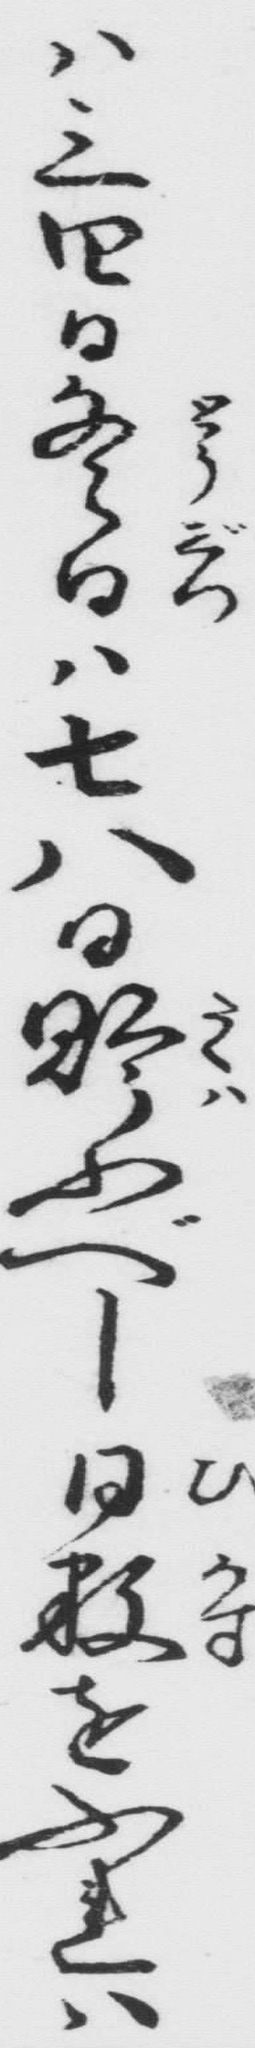は三四日冬日は七八日貯ふべし日数をふれは
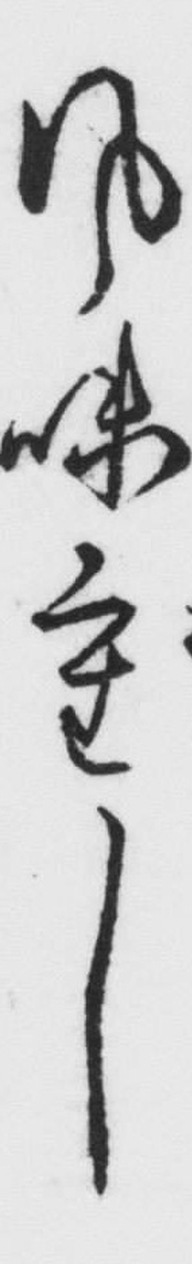風味重し
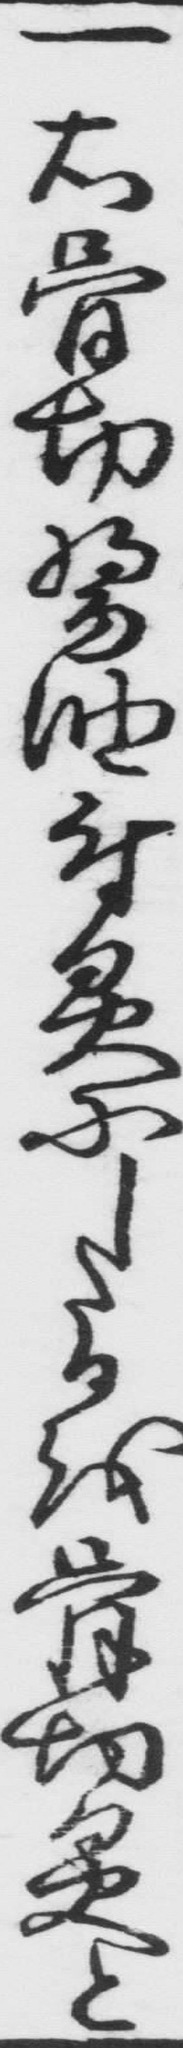一右骨切醤油付炙にしたるを骨切炙と

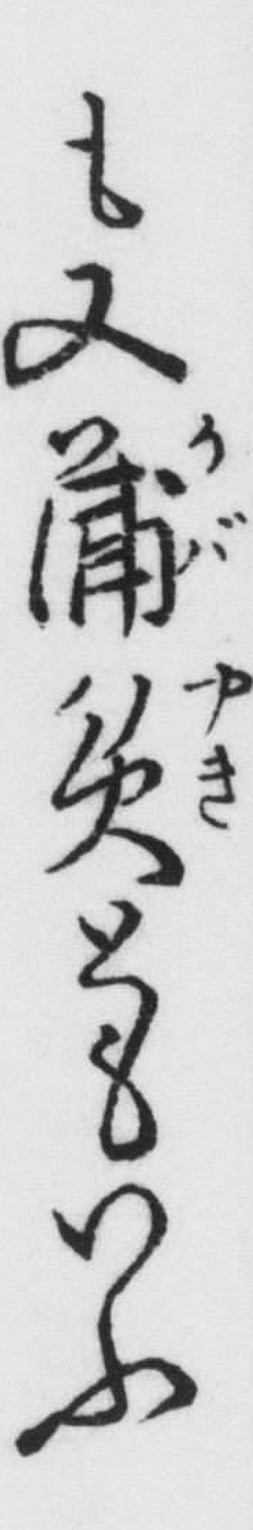も又蒲炙ともいふ
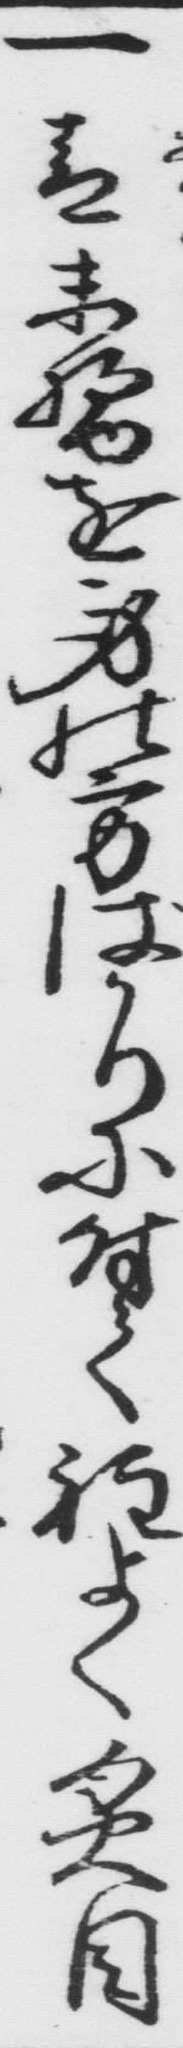一青未醤を身の方ばかりに付て程よく炙目
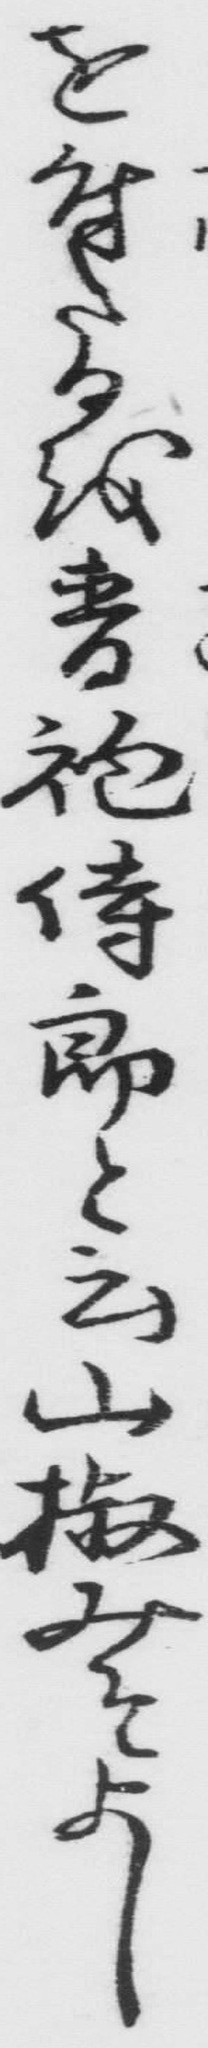を付たるを青袍侍郎と云山椒みそよし
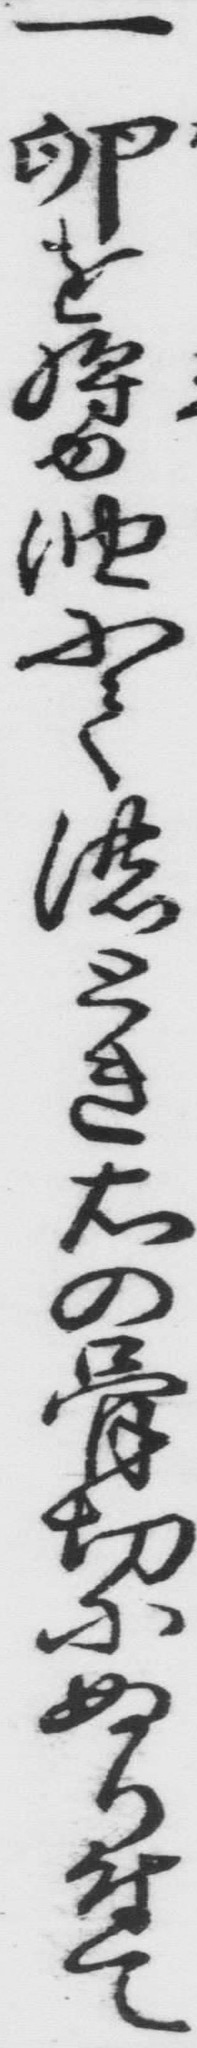一卵を醤油にて濃とき右の骨切にぬり付て
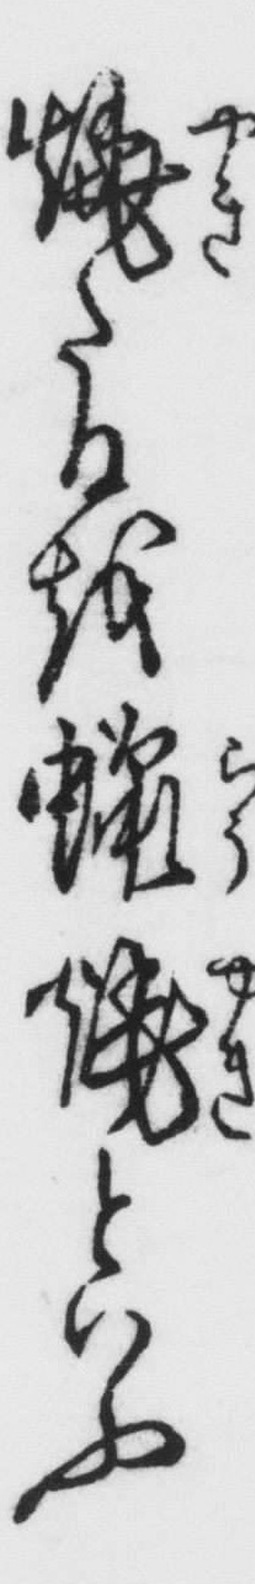燒たるを蝋燒といふ
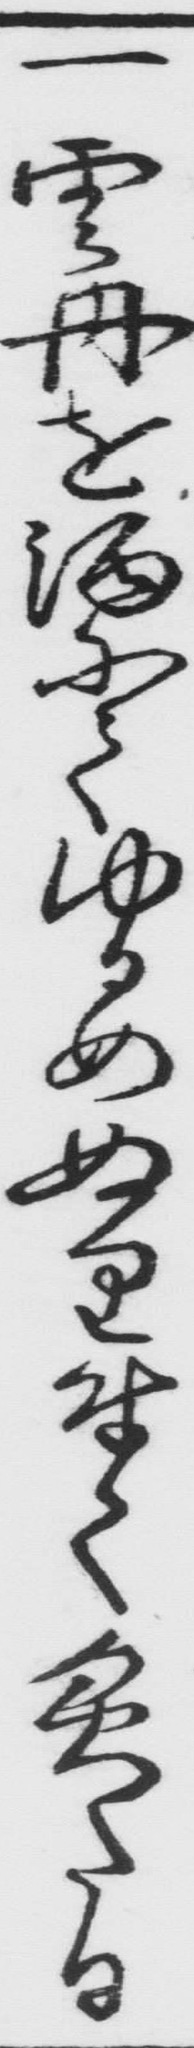一雲丹を酒にてゆるめぬり付て炙たる
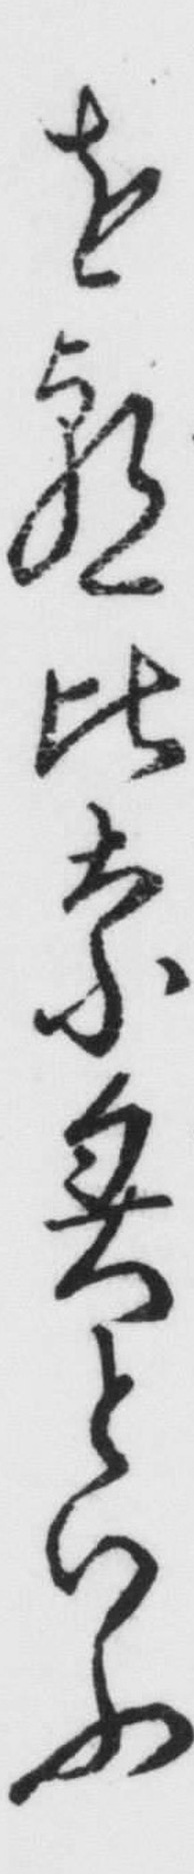を朝比奈炙といふ
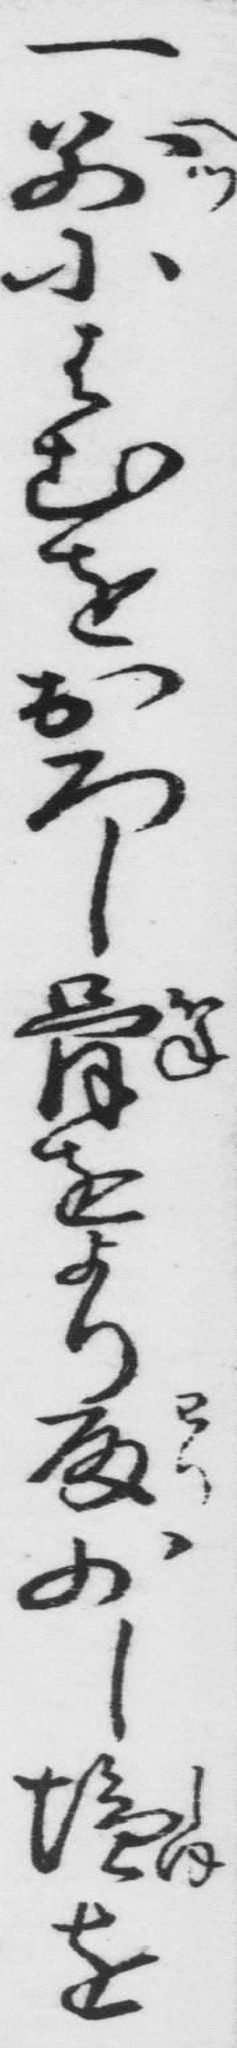一別にはむをおろし骨をより取少し塩を
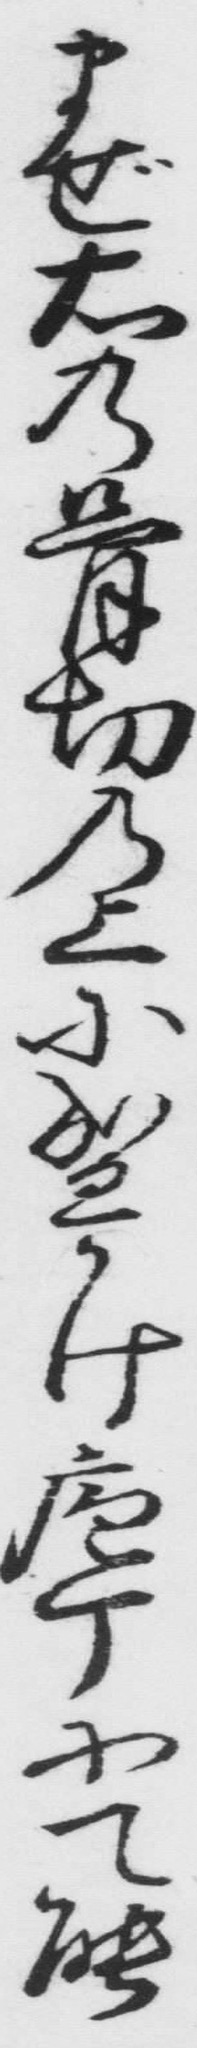まぜ右の骨切の上に盛かけ庖丁にて能
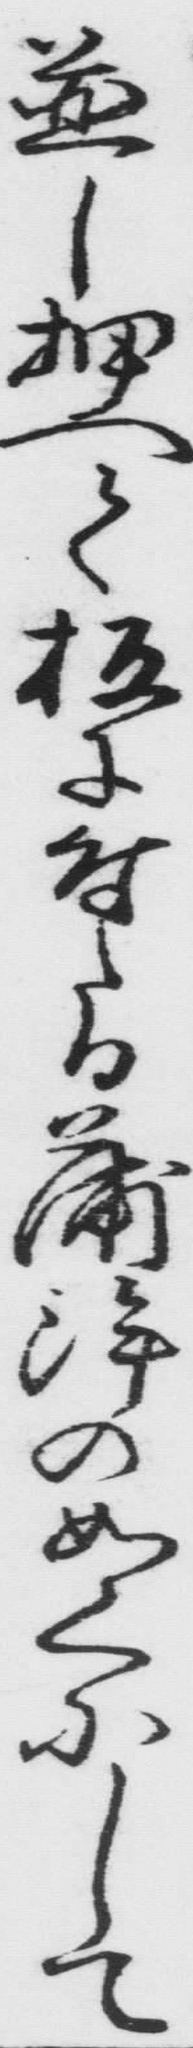並し押へて板に付たる蒲鉾の如くにして
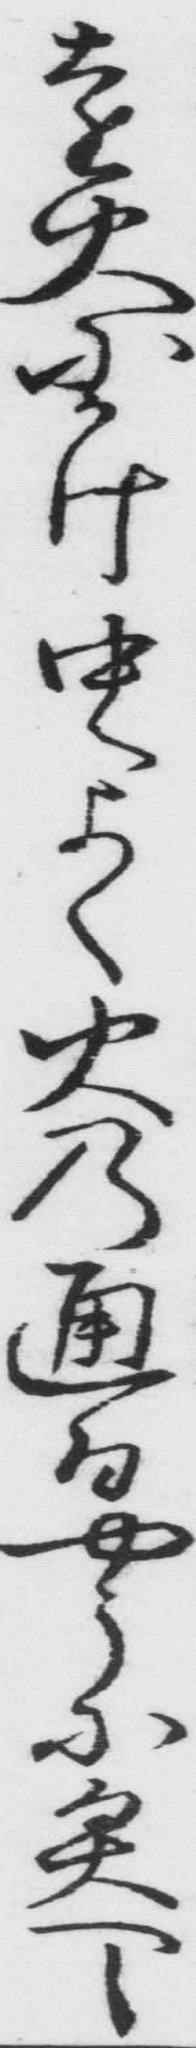遠火にかけ中ゝよく火の通るやうに炙へし
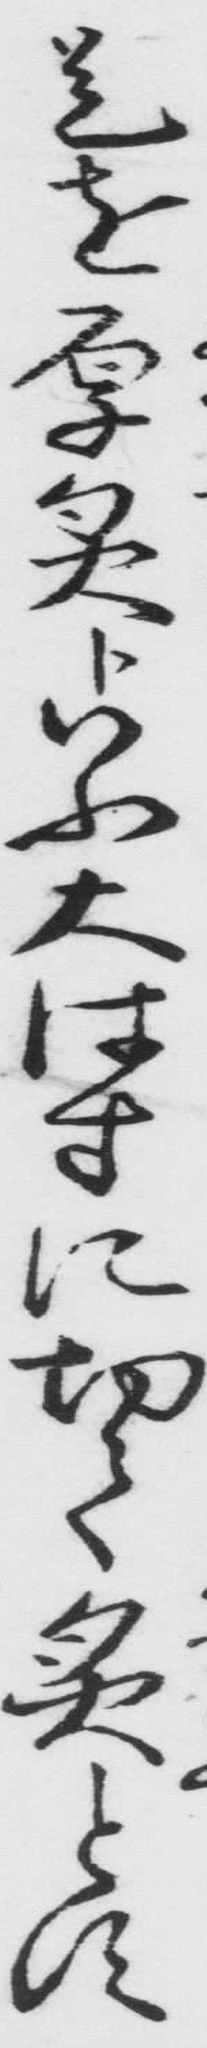是を厚炙といふ大はすに切て炙とす
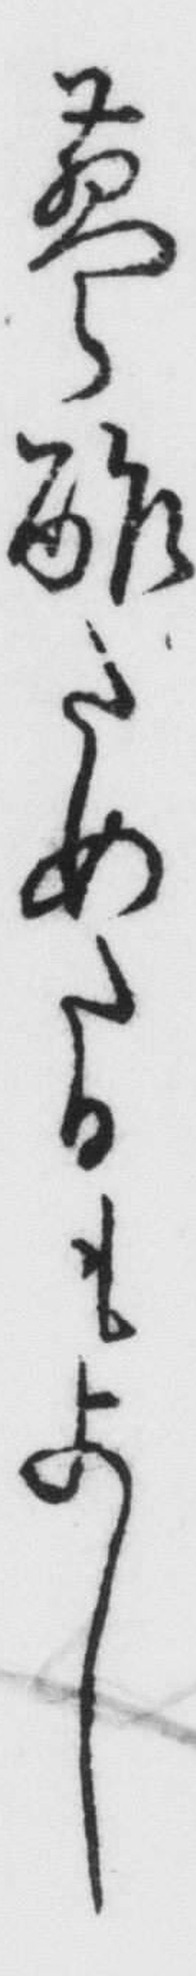蓼酢ためたるもよし
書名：海鰻百珍
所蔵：大阪府立大学学術情報センター 国文学研究資料館
